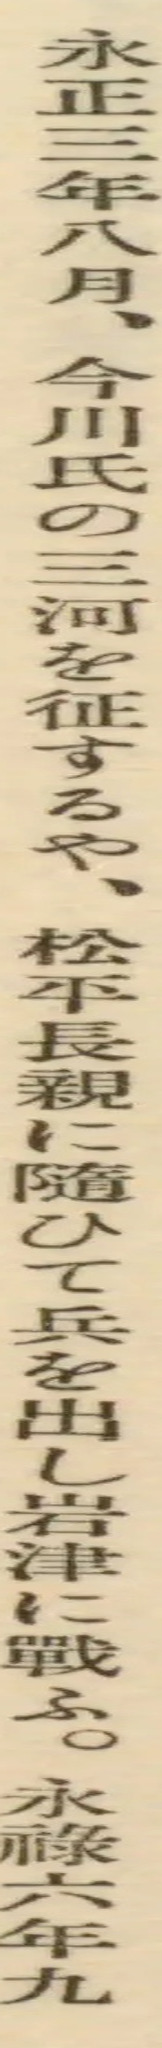永正三年八月、今川氏の三河を征するや、松平長親に随ひて兵を出し岩津に戦ふ。永禄六年九
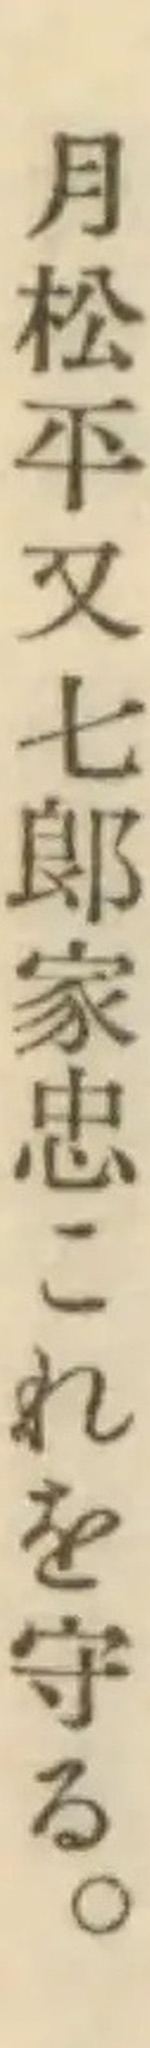月松平又七郎家忠これを守る。
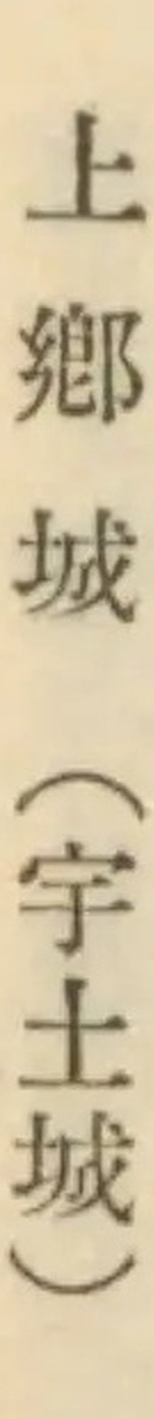上郷城(宇土城)
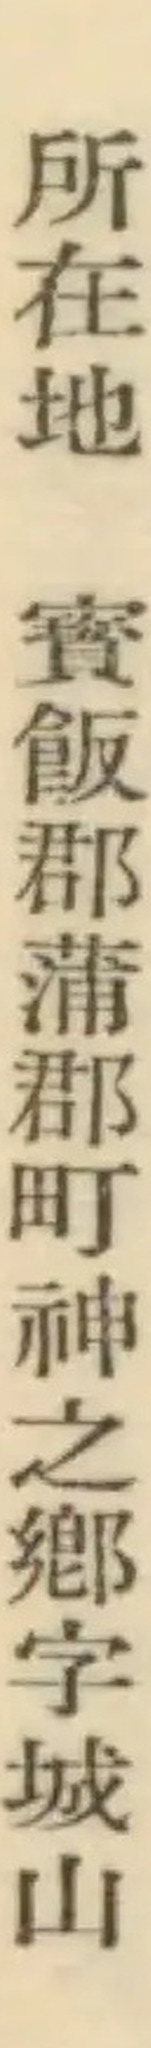所在地宝飯郡蒲郡町神之郷字城山
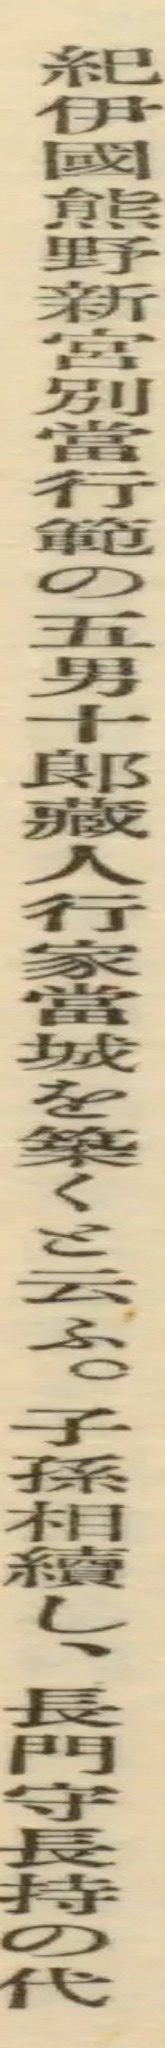紀伊國熊野新宮別当行範の五男十郎蔵人行家当城を築くと云ふ。子孫相続し、長門守長持の代
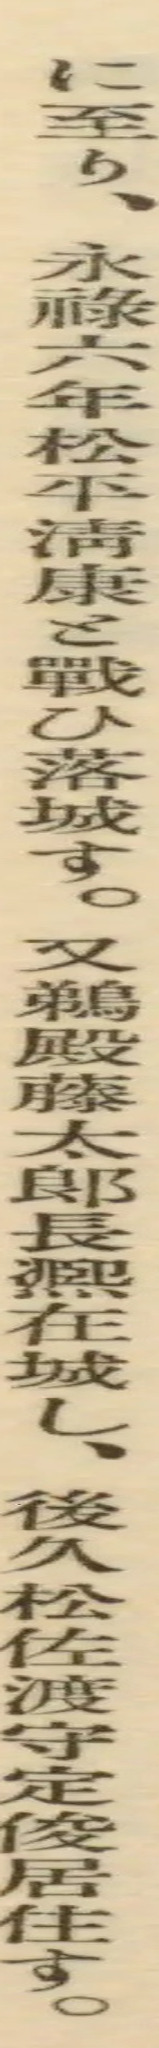に至り、永禄六年松平清康と戦ひ落城す。又鵜殿藤太郎長凞在城し、後久松佐渡守定俊居住す。
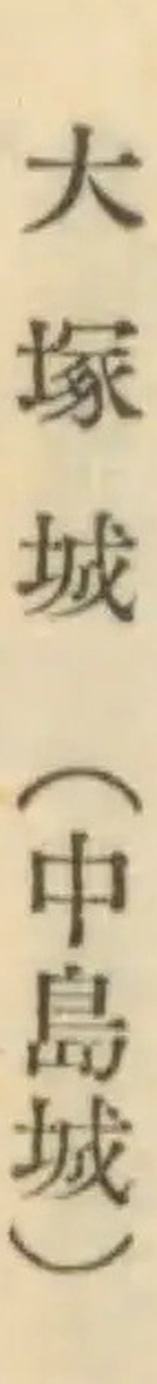大塚城(中島城)
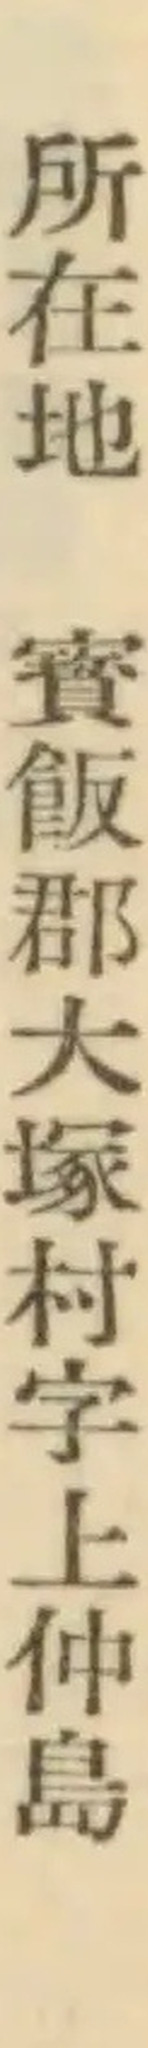所在地宝飯郡大塚村字上仲島
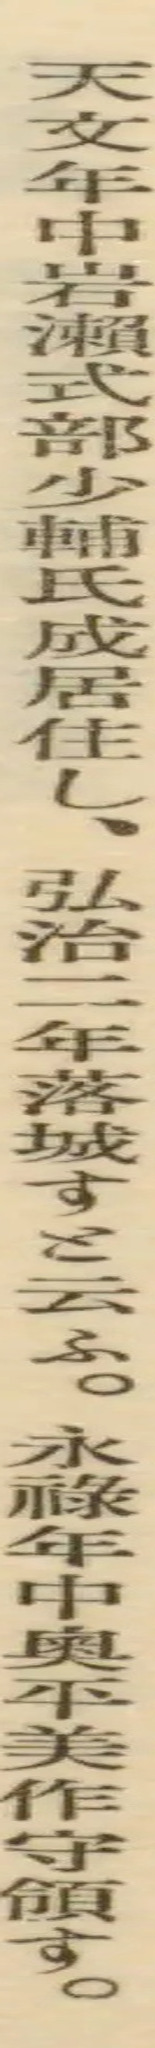天文年中岩瀬式部少輔氏成居住し、弘治二年落城すと云ふ。永禄年中奥平美作守領す。
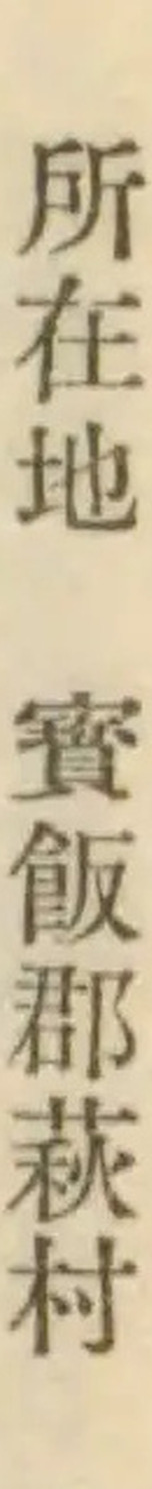所在地宝飯郡萩村
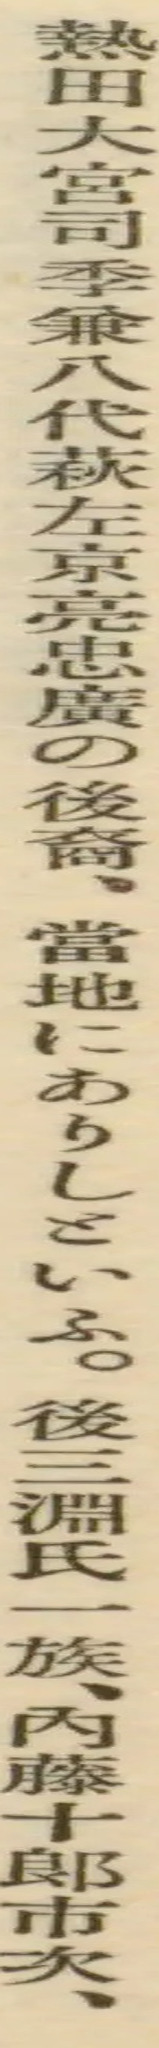熱田大宮司季兼八代萩左京亮忠広の後裔、当地にありしといふ。後三淵氏一族、内藤十郎市次、
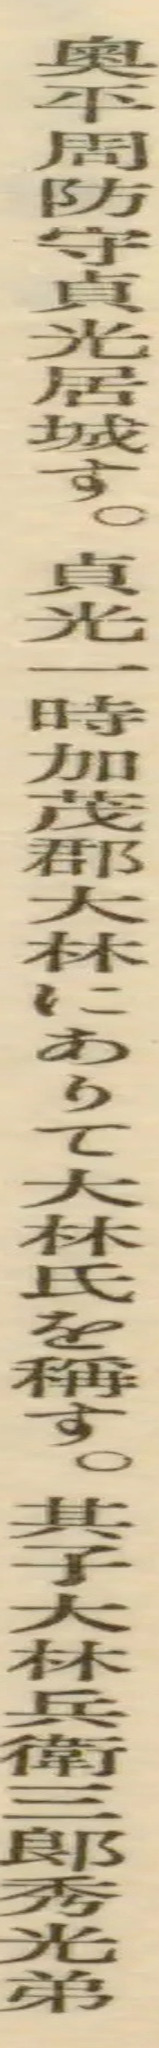奥平周防守貞光居城す。貞光一時加茂郡大林にありて大林氏を称す。其子大林兵衛三郎秀光弟
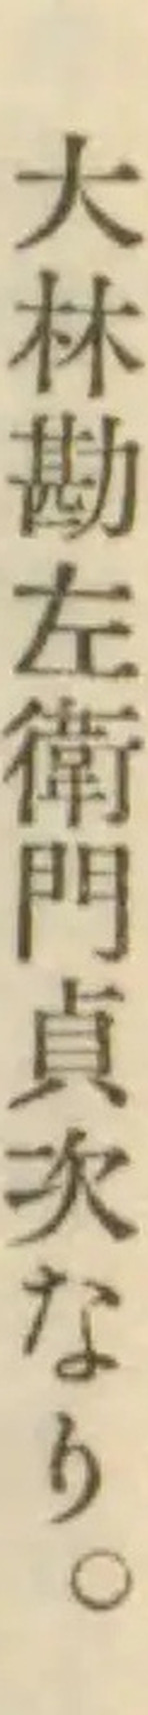大林勘左衛門貞次なり。
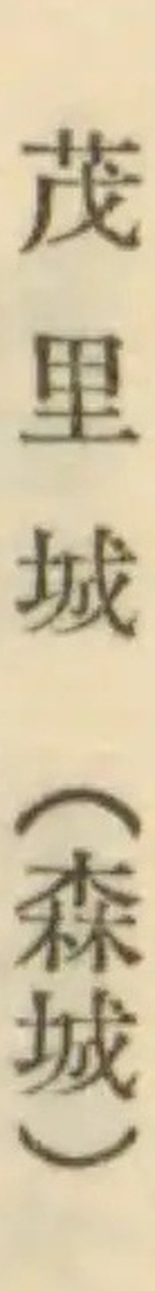茂里城(森城)
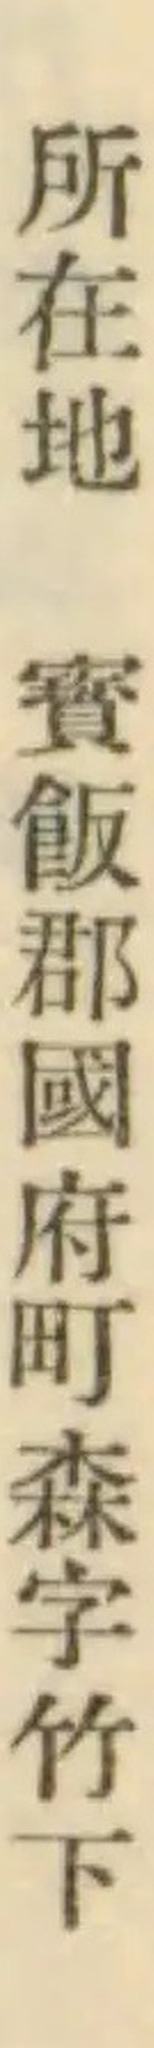所在地宝飯郡国府町森字竹下
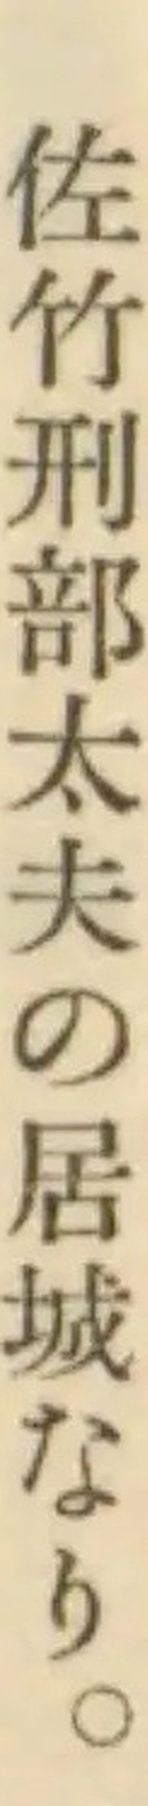佐竹刑部太夫の居城なり。
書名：東三河之古城
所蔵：国立国会図書館 National Diet Library, JAPAN
